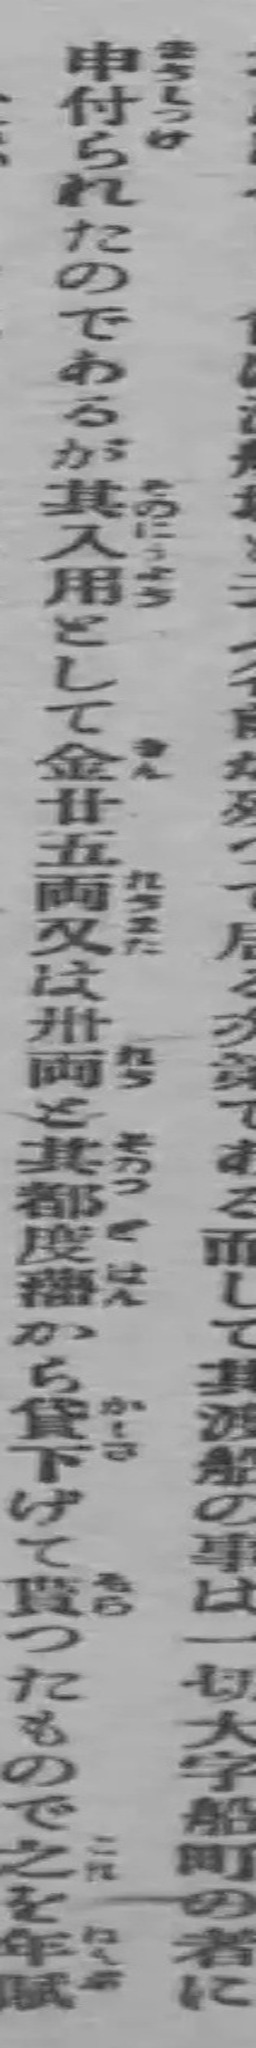申付られたのであるが其入用として金廿五両又は卅両と其都度藩から貸下げて貰つたもので之を年賦
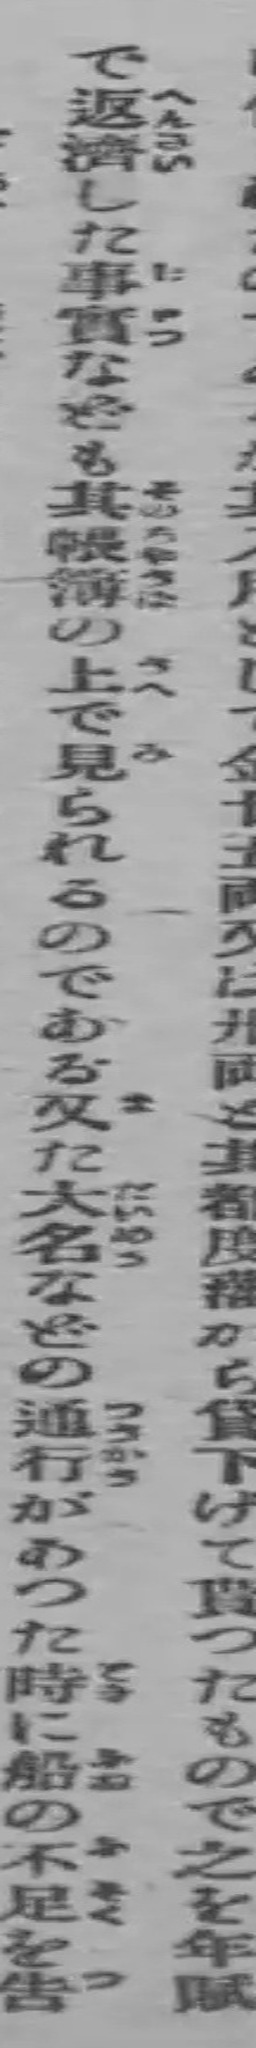で返済した事実なども其帳簿の上で見られるのである又た大名などの通行があつた時に船の不足を告
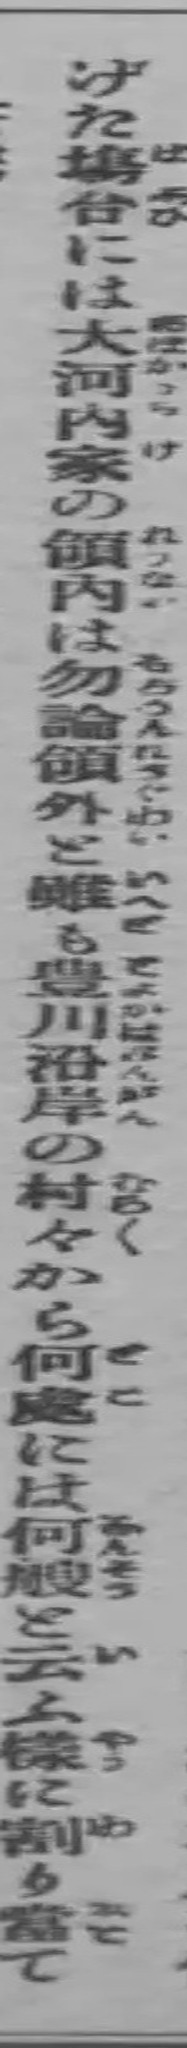げた場合には大河内家の領内は勿論領外と雖も豊川沿岸の村々から何処には何艘と云ふ様に割り当て
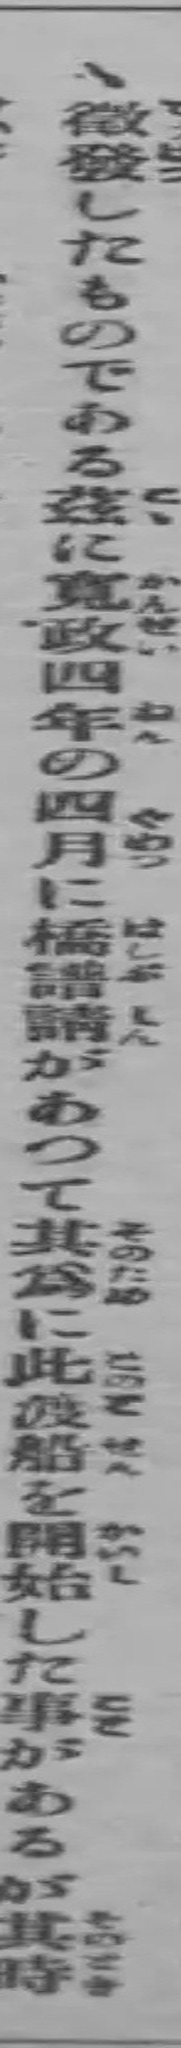ゝ徴発したものである茲に寛政四年の四月に橋普請があつて其為に此渡船を開始した事があるが其時
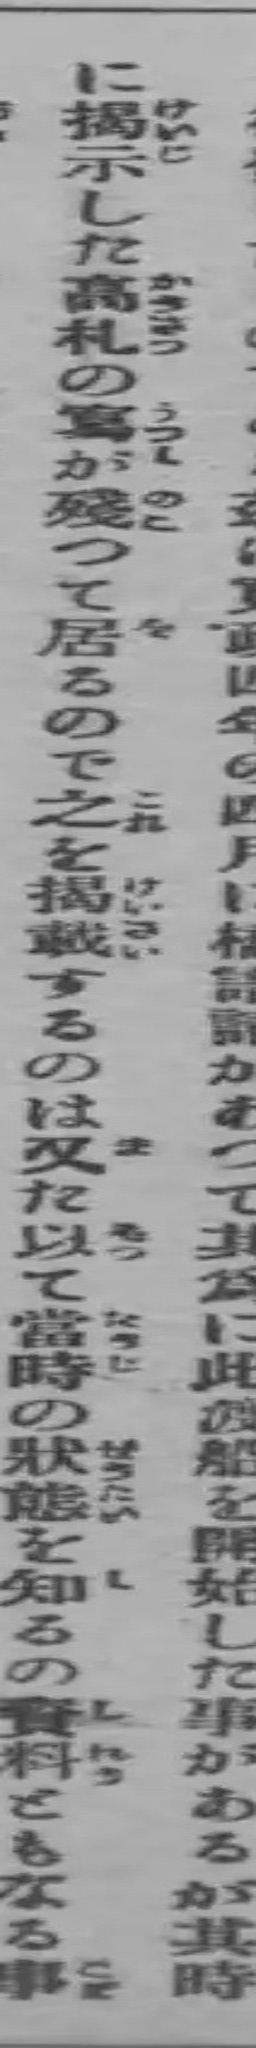に掲示した高札の写が残つて居るので之を掲載するのは又た以て当時の状態を知るの資料ともなる事
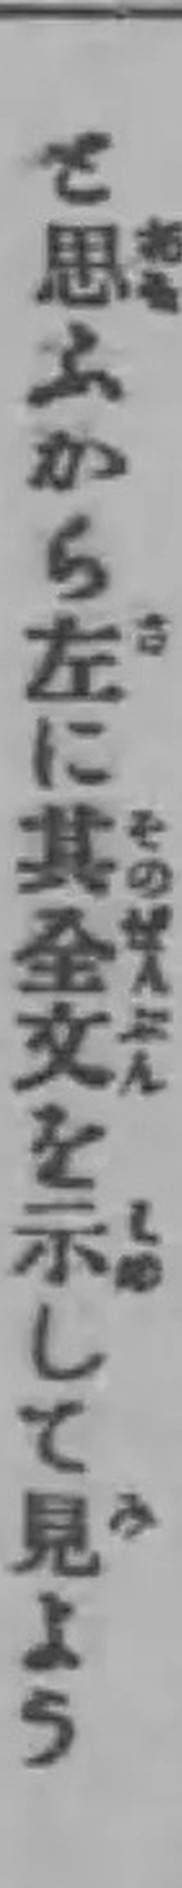と思ふから左に其全文を示して見よう
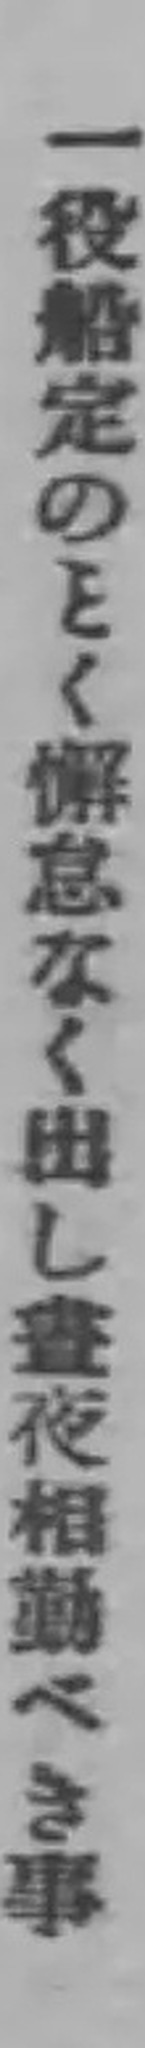一役船定のことく懈怠なく出し昼夜相勤べき事
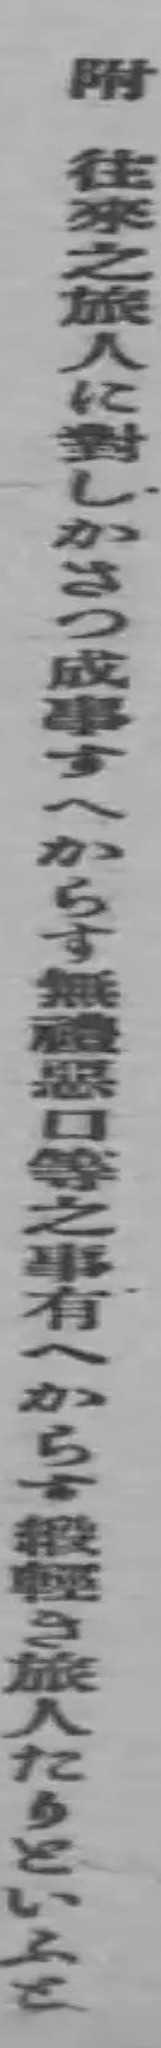附往来之旅人に対しかさつ成事すへからす無礼悪口等之事有へからす緞軽き旅人たりといふと
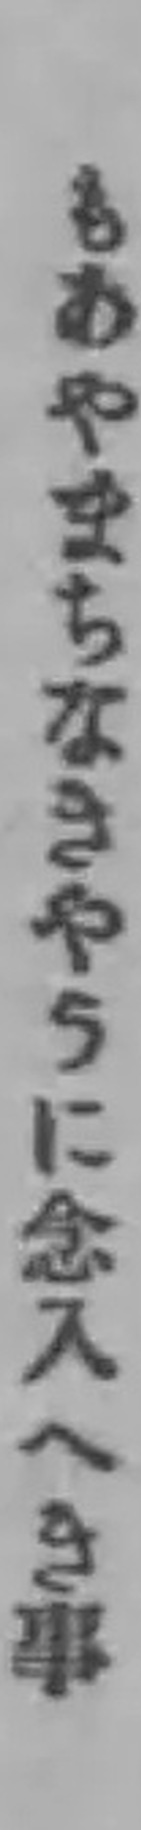もあやまちなきやうに念入へき事
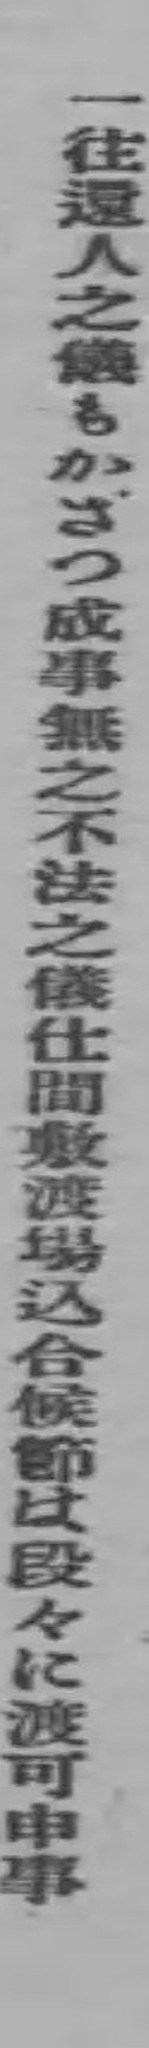一往還人之儀もかさつ成事無之不法之儀仕間敷渡場込合候節は段々に渡可申事
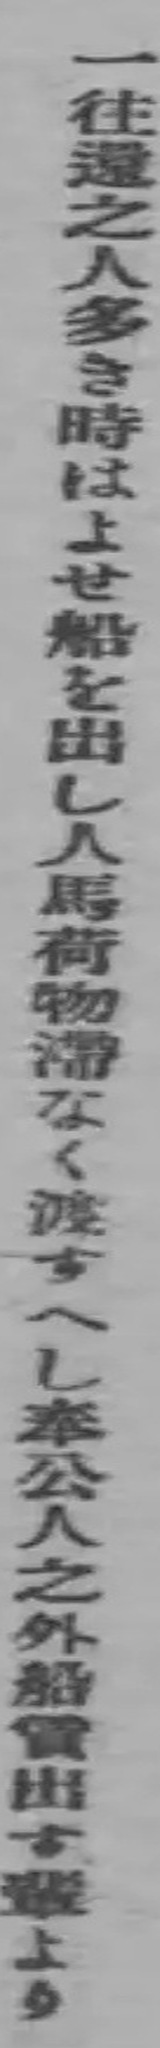一往還之人多き時はよせ船を出し人馬荷物滞なく渡すへし奉公人之外船賃出す輩より
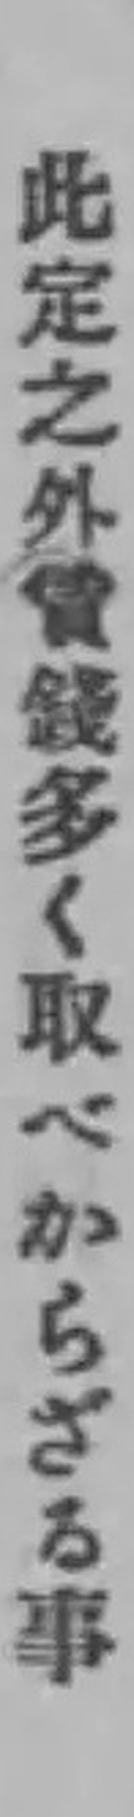此定之外賃銭多く取るべからざる事
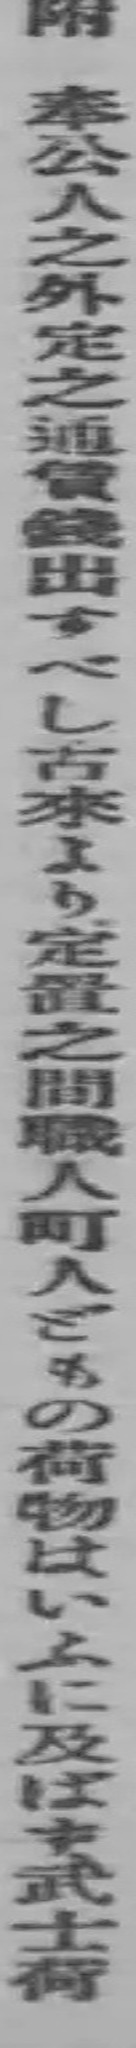附奉公人之外定之通賃銭出すべし古来より定置之間職人町どもの荷物はいふに及ばず武士荷
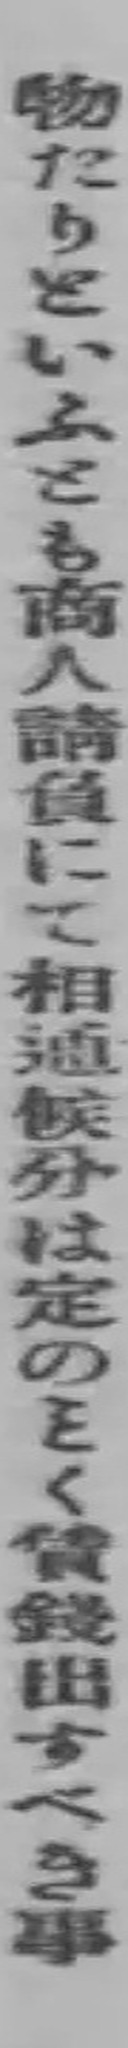物たりといふとも商人請負にて相通候分は定のことく賃銭出すべき事
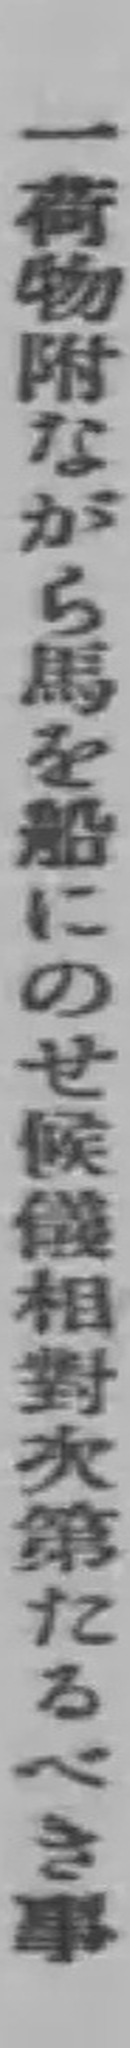一荷物附ながら馬を船にのせ候儀相対次第たるべき事
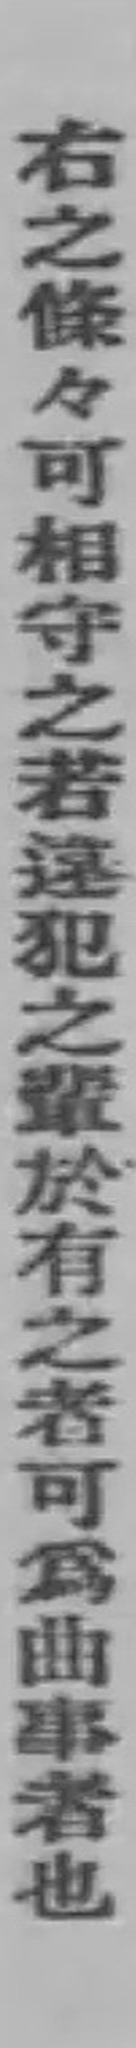右之條々可相守之若違犯之輩於有之者可為曲事者也
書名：豊橋市史談
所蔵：国立国会図書館 National Diet Library, JAPAN
